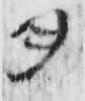月
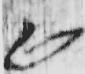㠯（以）
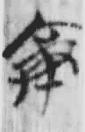○（就）
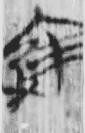○（集）
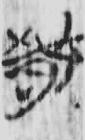歲（歲）
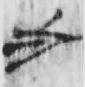之
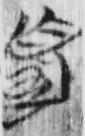○（夏）
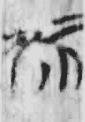𫵖
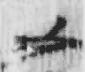之
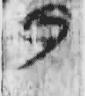月
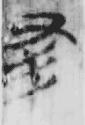○（盡）
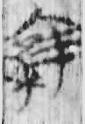○（集）
